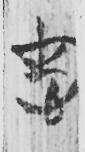{才心}
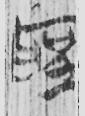聖
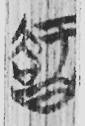智
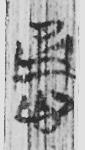恿
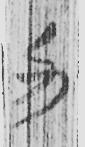力
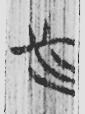必
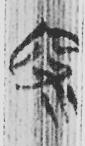罙
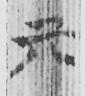亓
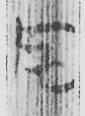厇
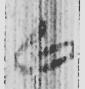㠯（以）
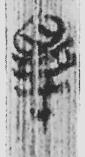{目辛}
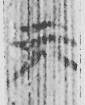亓
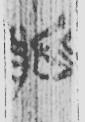{爿頁}
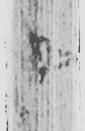身
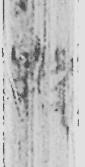與
